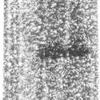一
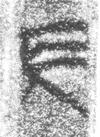長
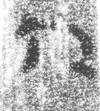六
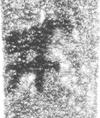灷（寸）
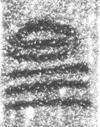泊
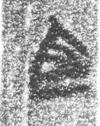且（組）
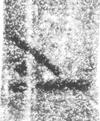之
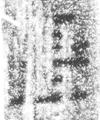綳
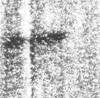一
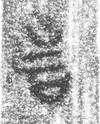青
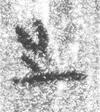之
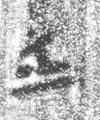○（徑）
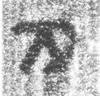四
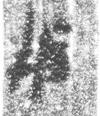灷（寸）
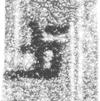灷（寸）
